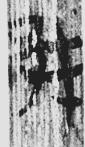邦
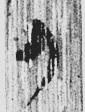人
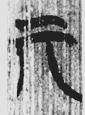亓（其）
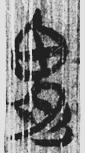{胃刀}（謂）
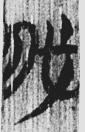我
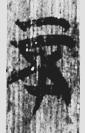不
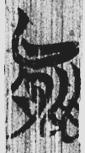能
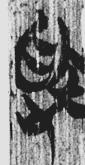○（爯稱○）
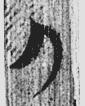人
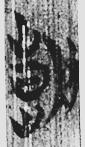朝
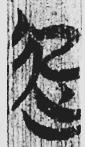○（起）
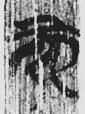而
